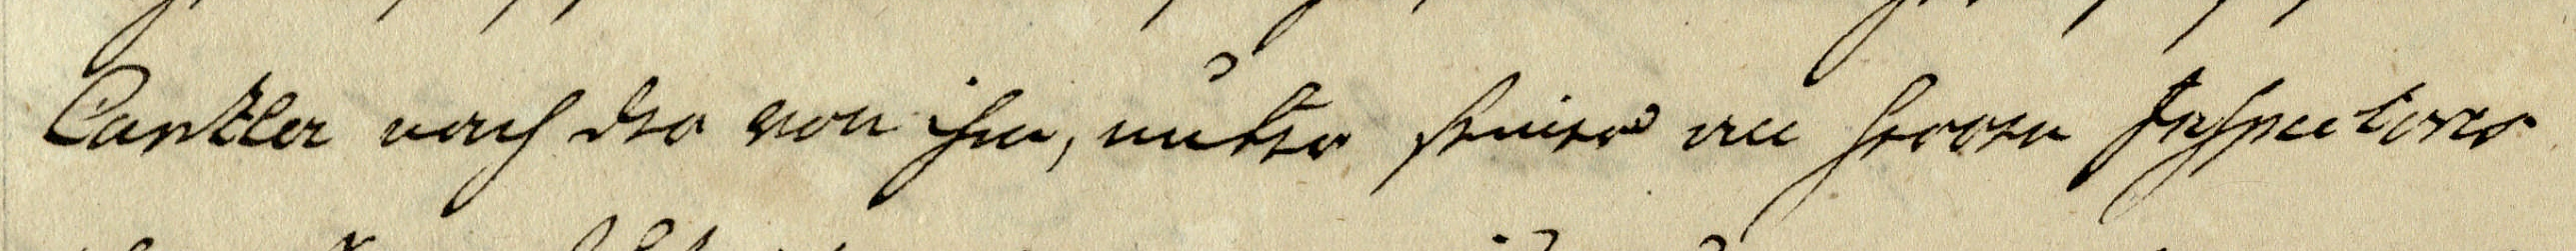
Canzler nach der von ihm, unter seiner an Herren Inspectores
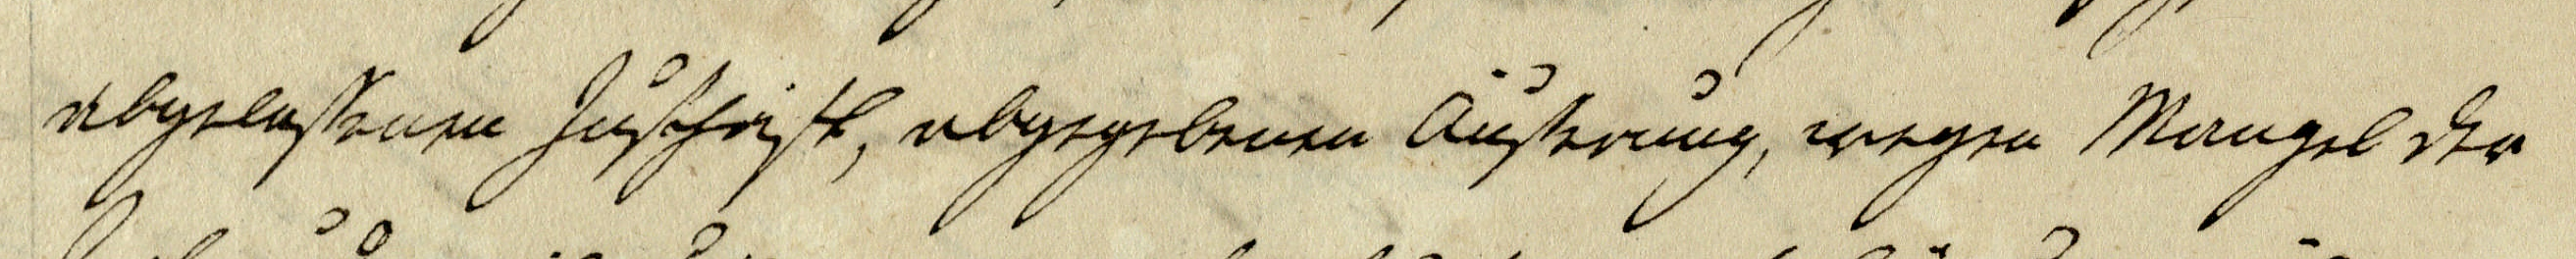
abgelassenen Zuschrift, abgegebenen Äusserung, wegen Mangel der
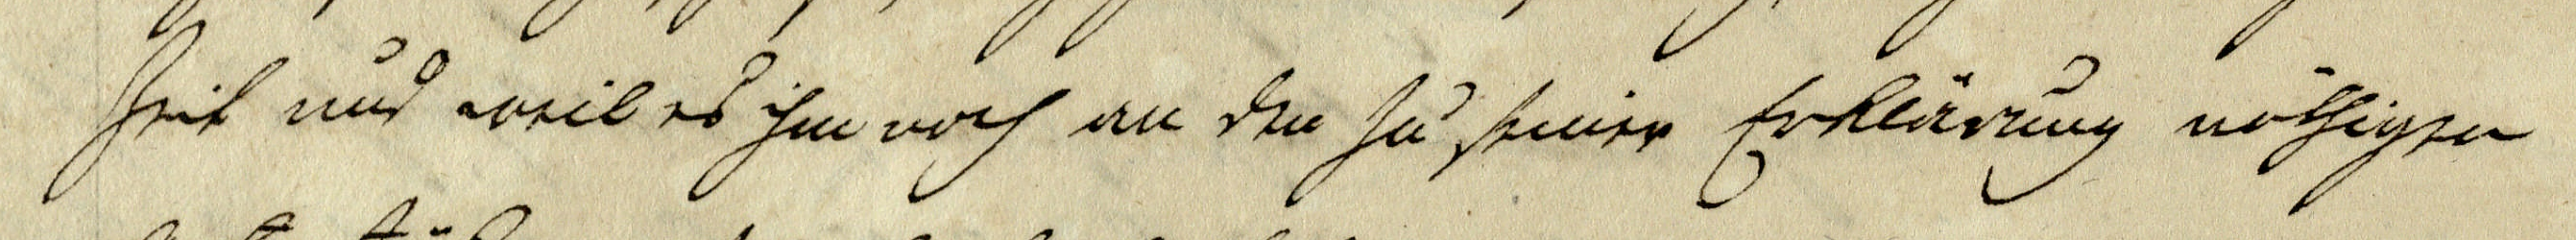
Zeit und weil es ihm noch an den zu seiner Erklärung nöthigen
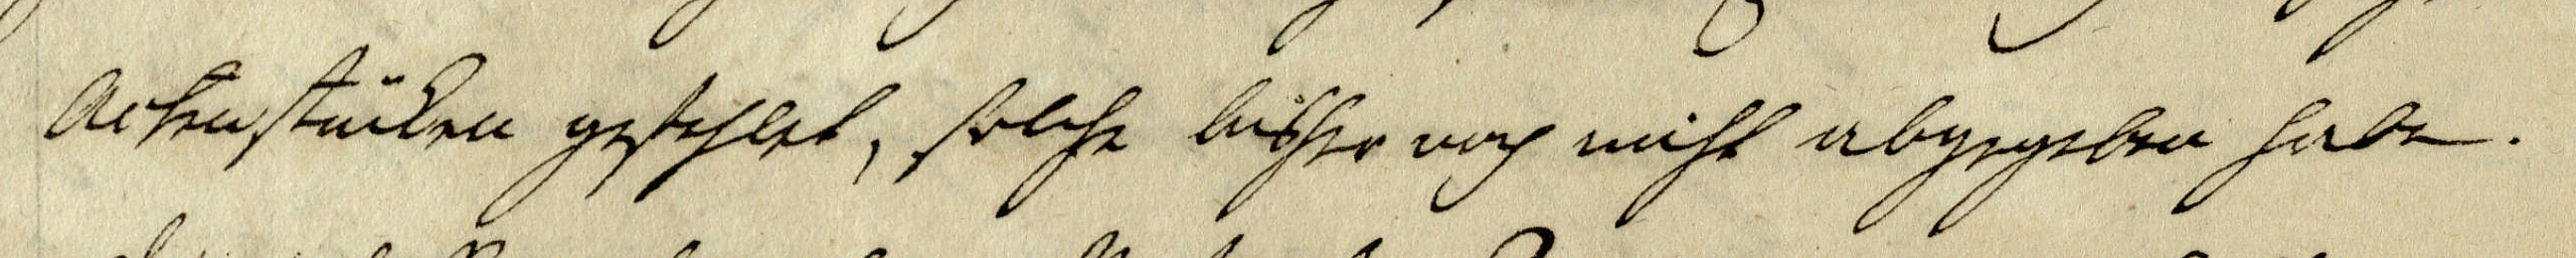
Actenstücken gefehlet, solche bisher noch nicht abgegeben habe.
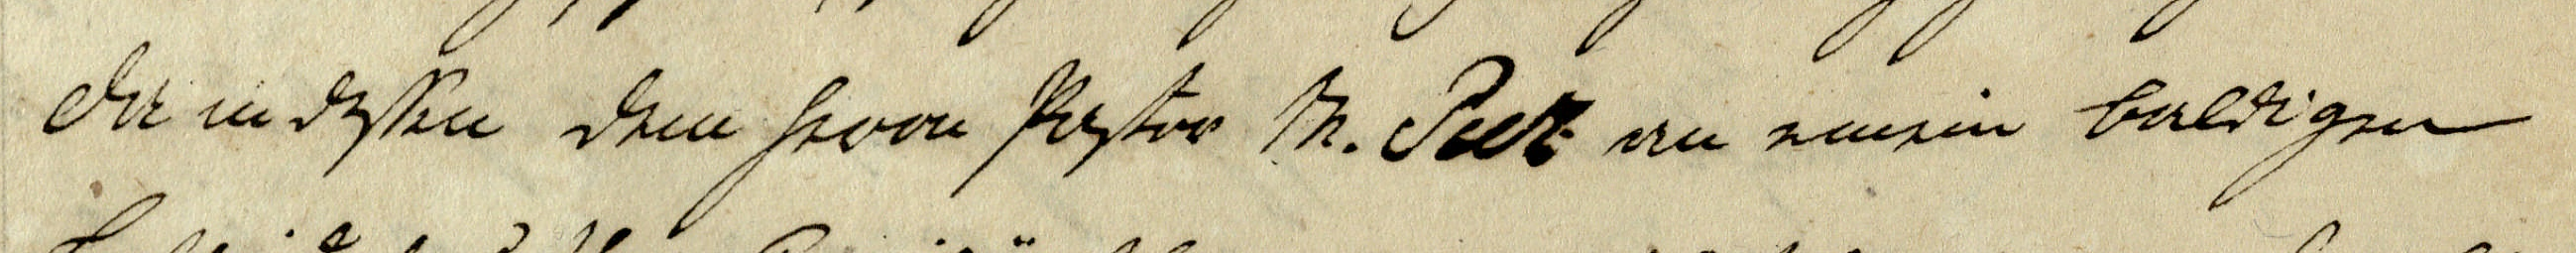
Da indessen dem Herrn Pastor M. Pelz an einem baldigen
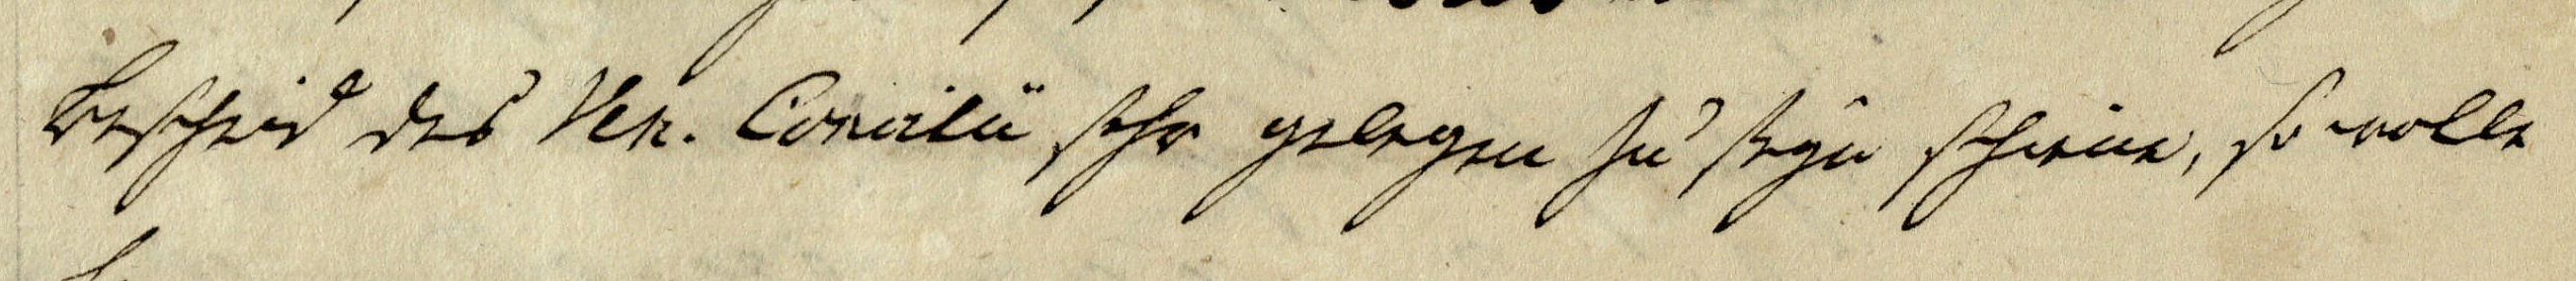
Bescheid des Ven. Concilii sehr gelegen zu seÿn schiene, so wolle
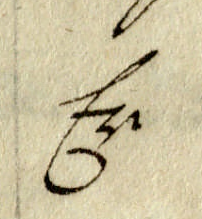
Er
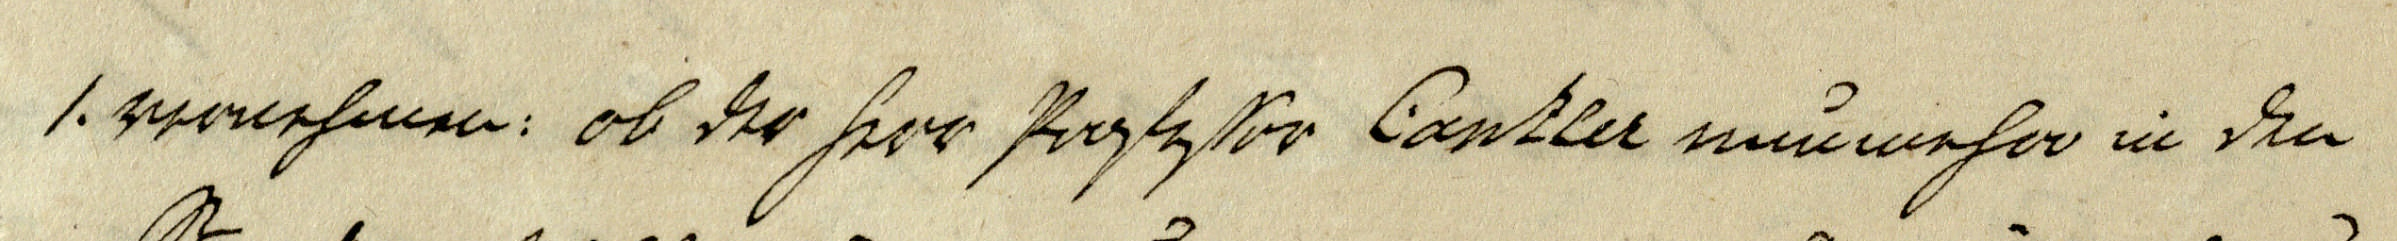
1. vernehmen: ob der Herr Professor Canzler nunmehro in den
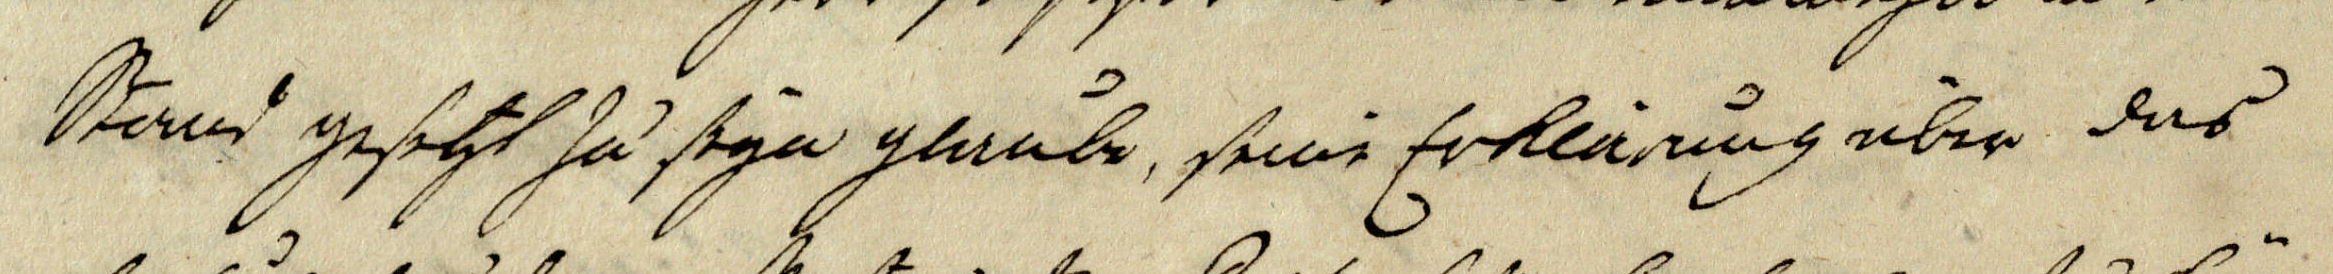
Stand gesetzt zu seÿn glaube, seine Erklärung über das
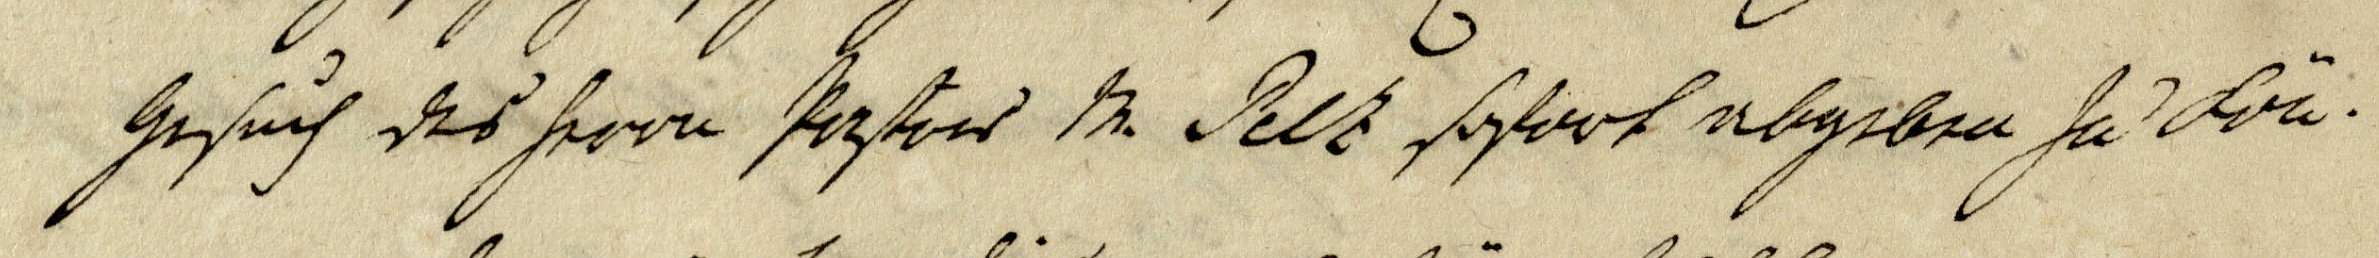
Gesuch des Herrn Pastors M. Pelz sofort abgeben zu kön¬
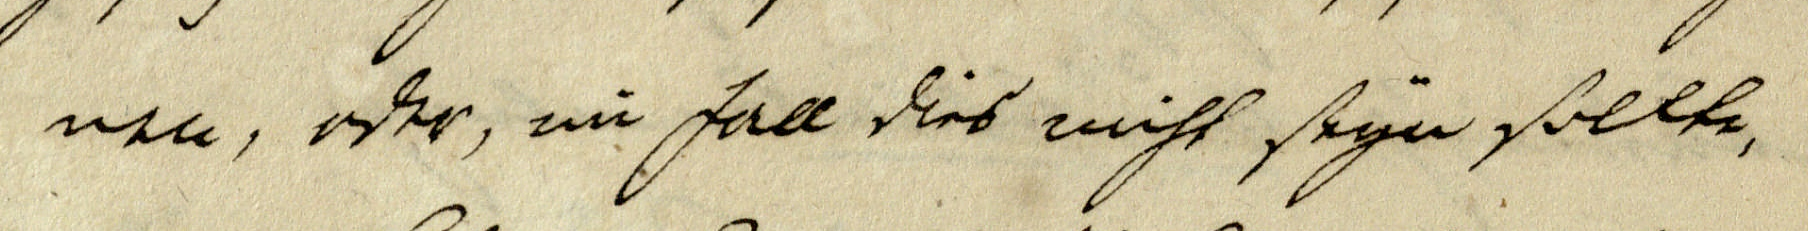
nen, oder, im Fall dies nicht seÿn sollte,
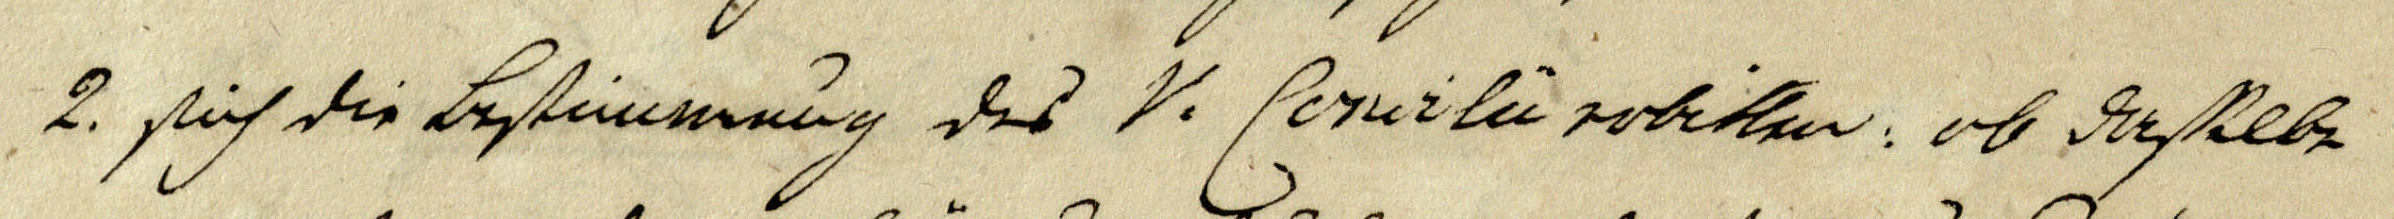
2. sich die Bestimmung des V. Concilii erbitten: ob dasselbe
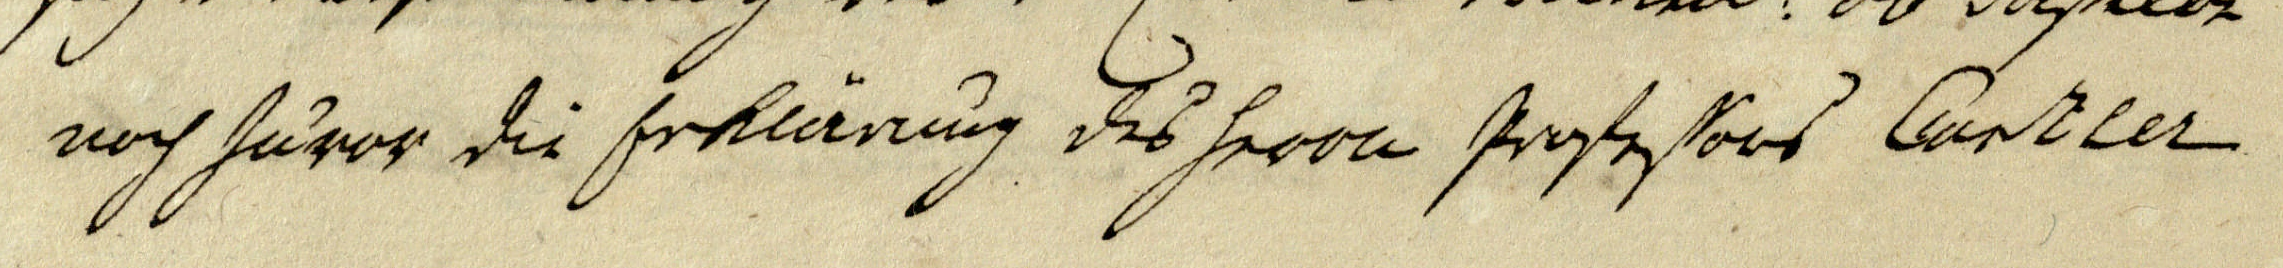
noch zuvor die Erklärung des Herrn Professors Canzler
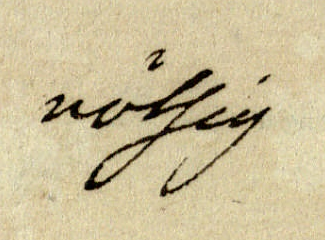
nöthig
